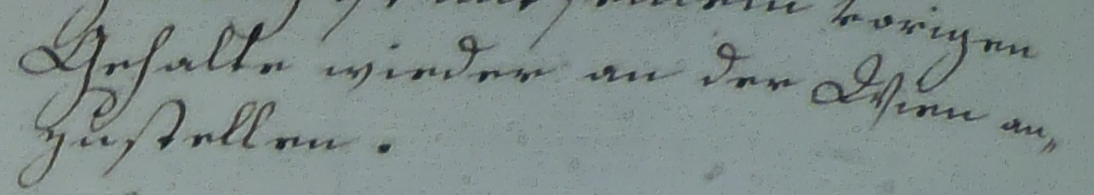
Gehalte wieder an der Wien an¬
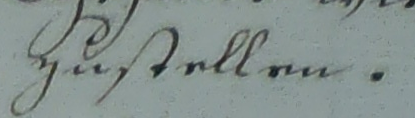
zustellen.
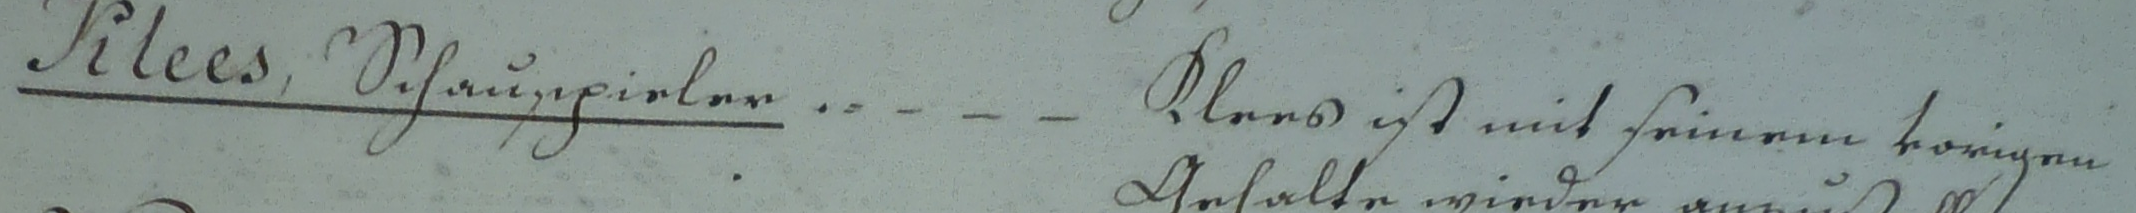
Klees, Schauspieler . _ _ _ _ Klees ist mit seinem vorigen
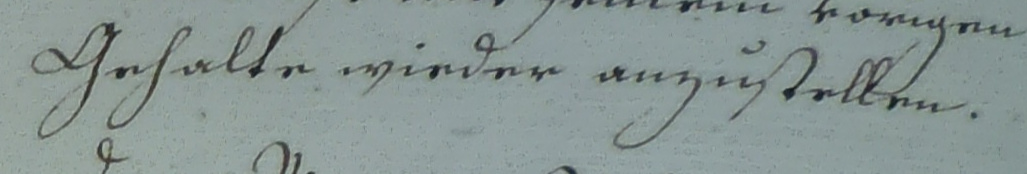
Gehalte wieder anzustellen.
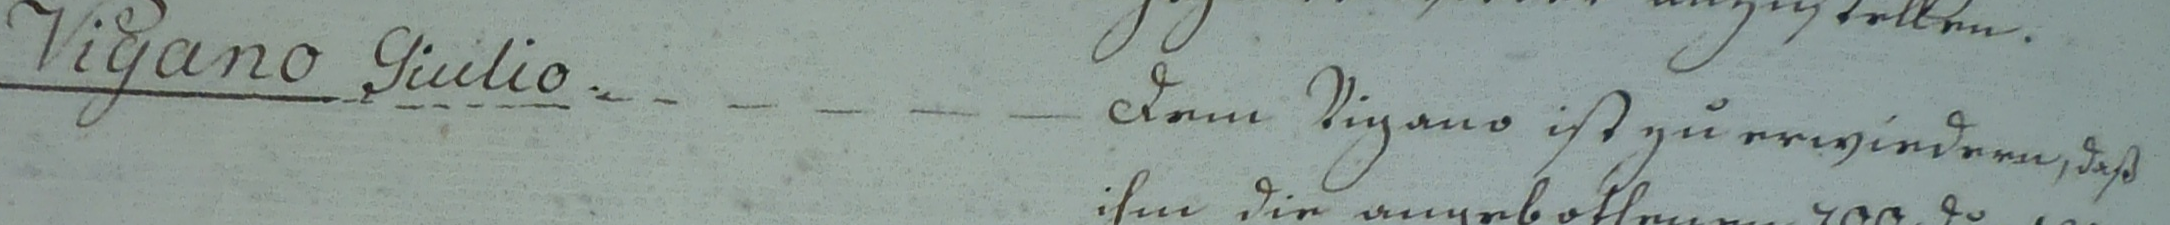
Vigano Giulio _ _ _ _ _ _ Dem Vigani ist zu erwiedern, daß
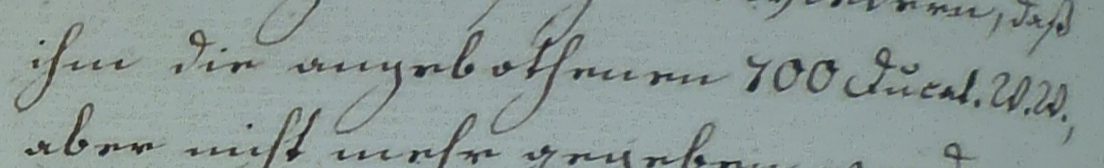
ihm die angebothenen 700 Ducat.W.W.,
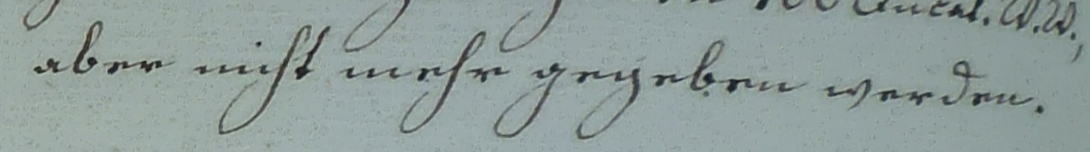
aber nicht mehr gegeben werden.
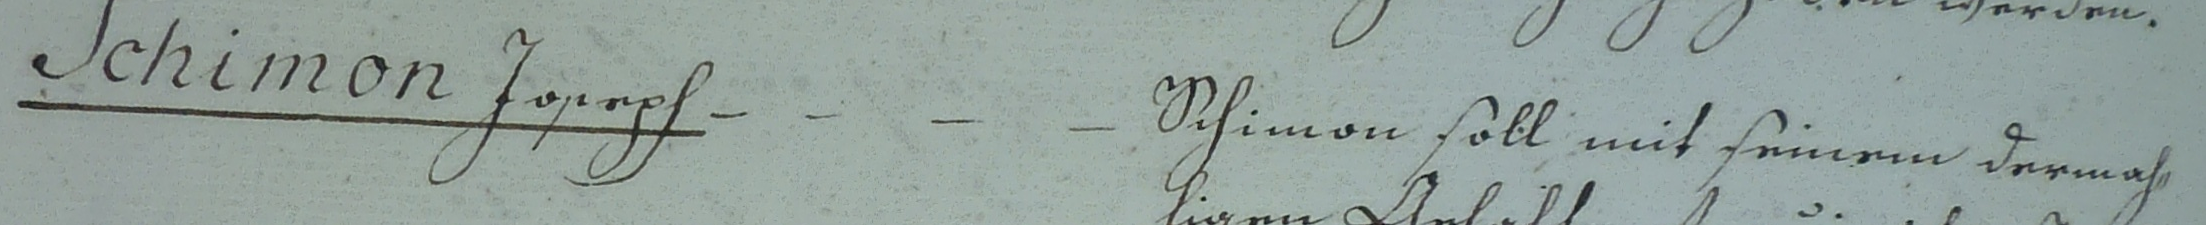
Schimon Joseph _ _ _ _ Schimon soll mit seinem dermah¬
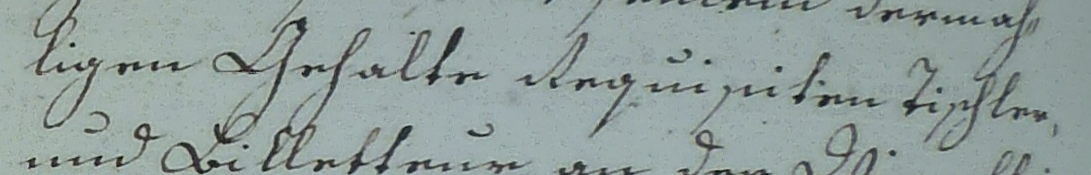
ligen Gehalte Requisiten Tischler,
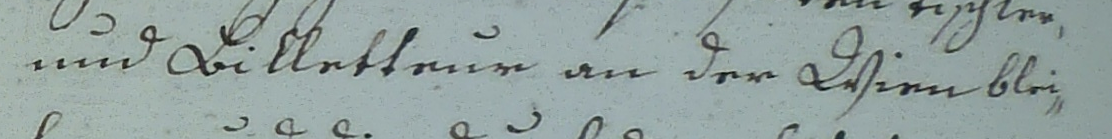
und Billeteur an der Wien blei¬
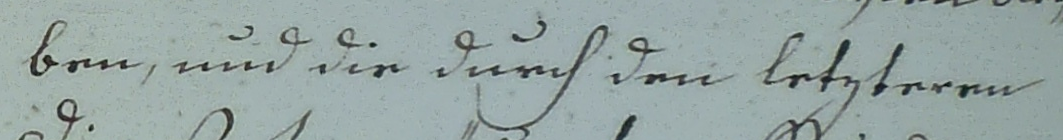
ben, und die durch den letzteren
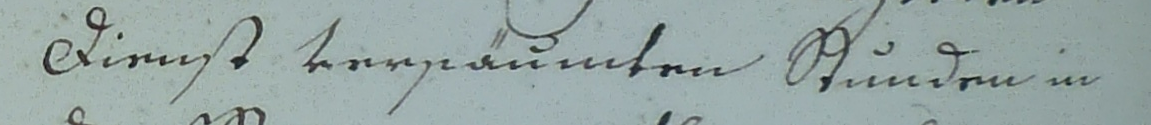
Dienst versäumten Stunden in
